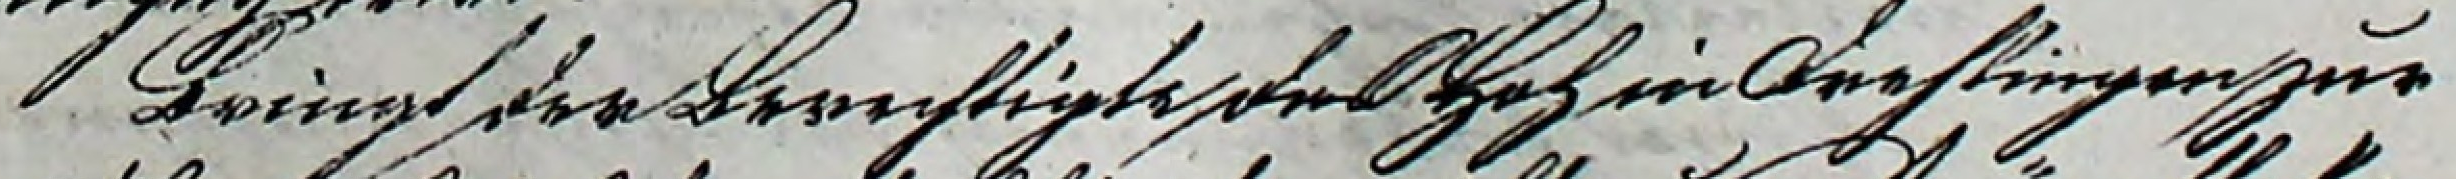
Bringt der Berechtigte das Holz in Drehlingen zur
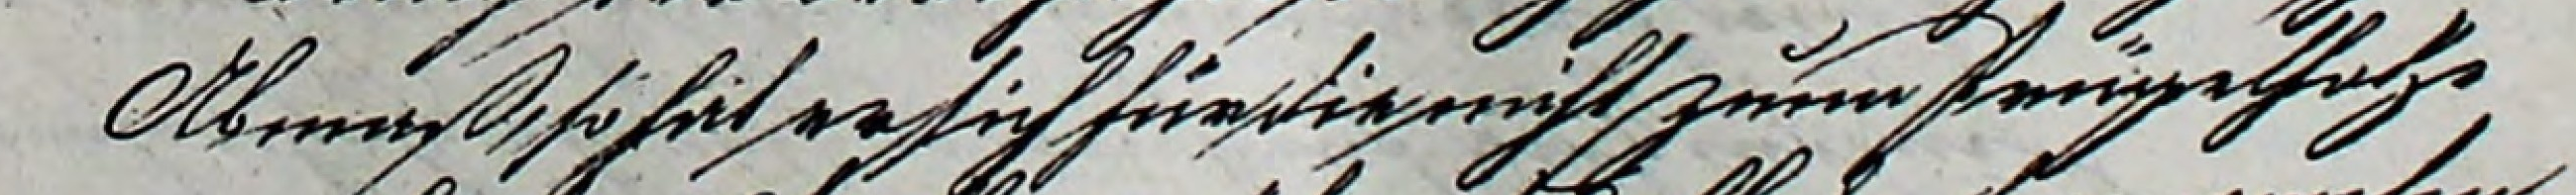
Abmaß, so hat er sich für die nicht Zaun Prügelholze
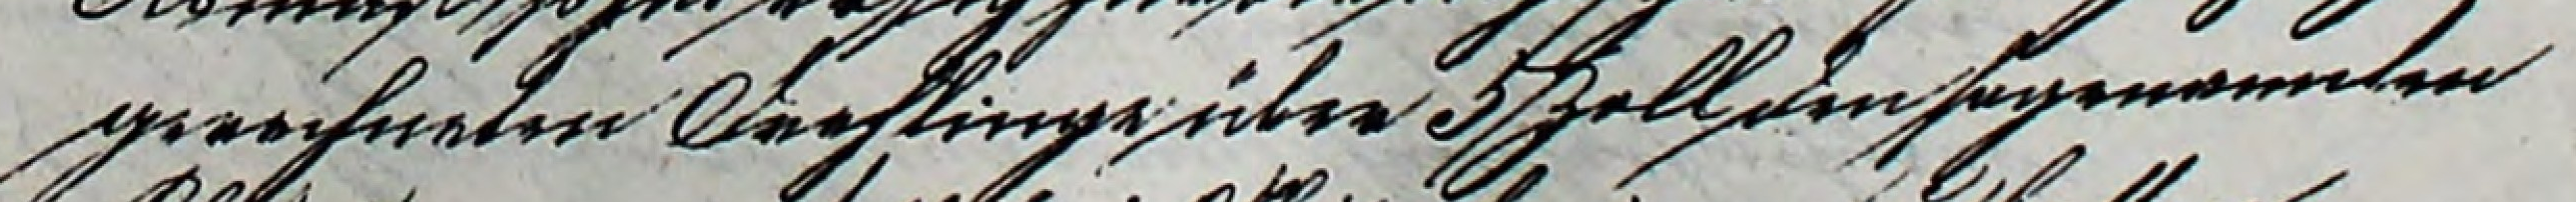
gerechneten Drehlinge über 5 Zoll den sogenannten
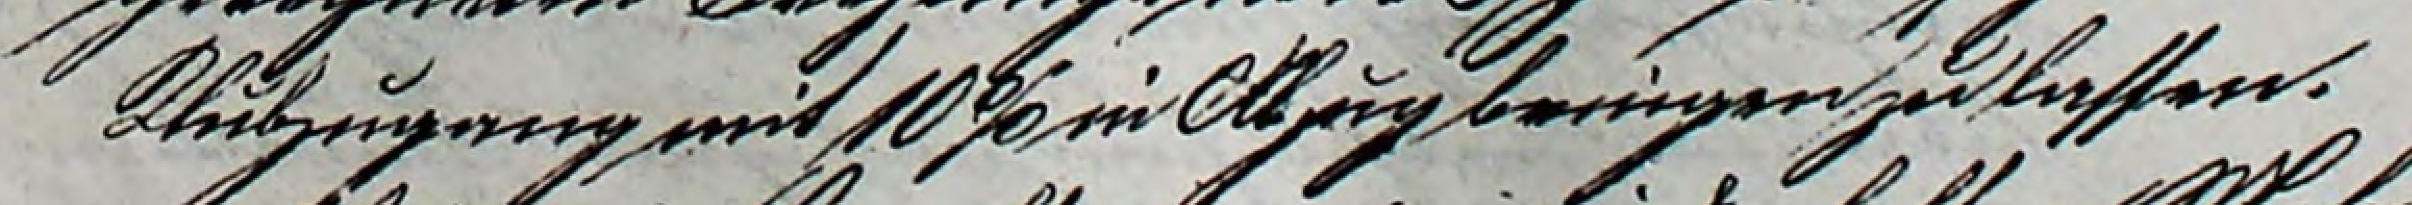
Klubzugang mit 10% in Abzug bringen zu lassen.
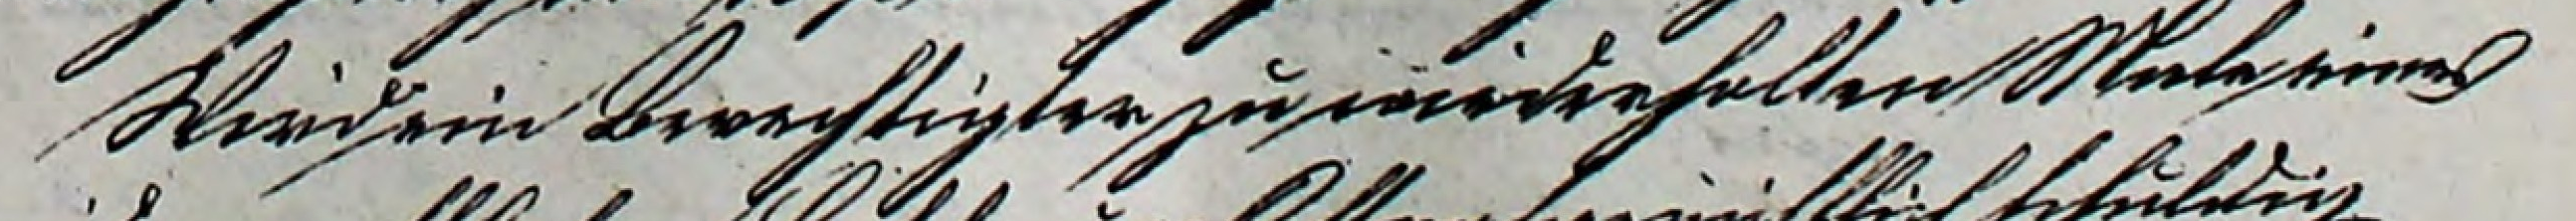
Wird ein Berechtigter zu wiederholten Male eines
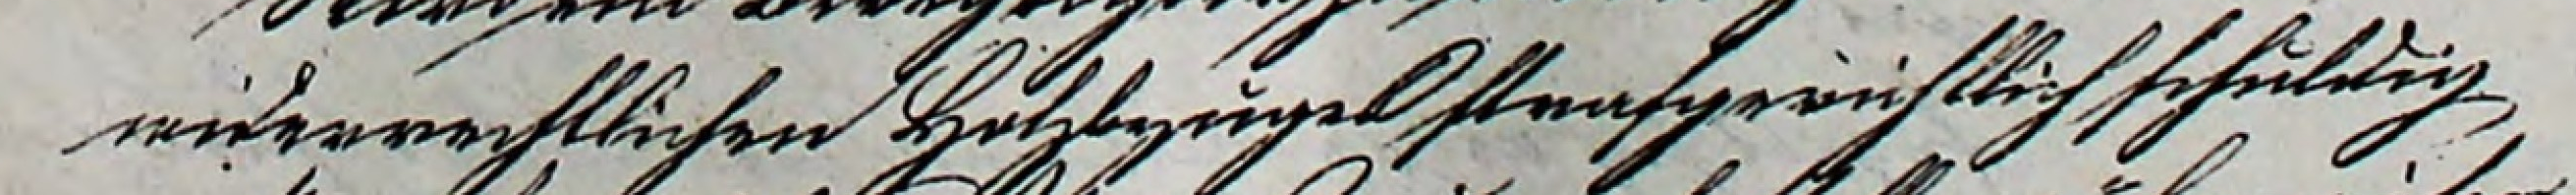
widerrechtlichen Holzbezuges strafgerichtlich schuldig
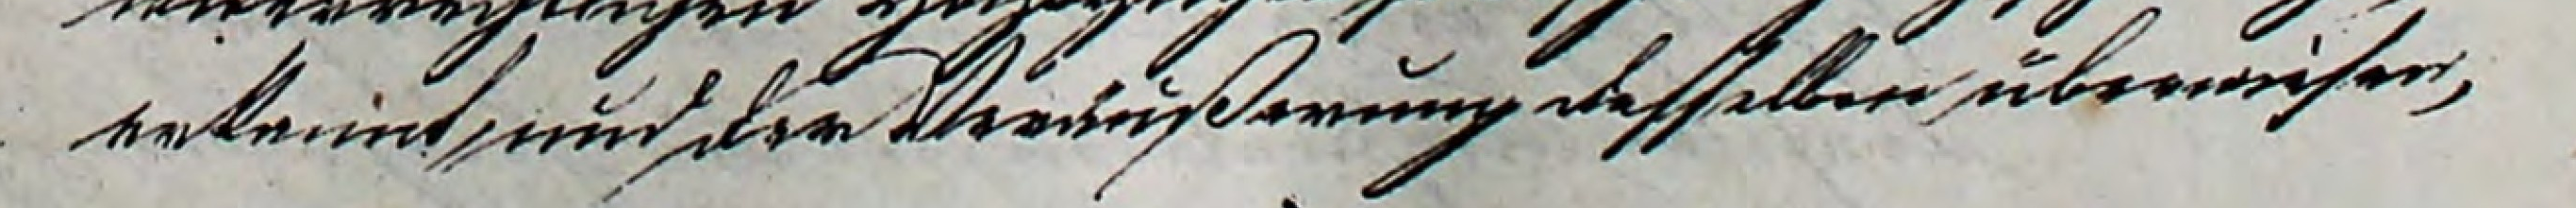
erkannt, und der Veräußerung desselben überwiesen,
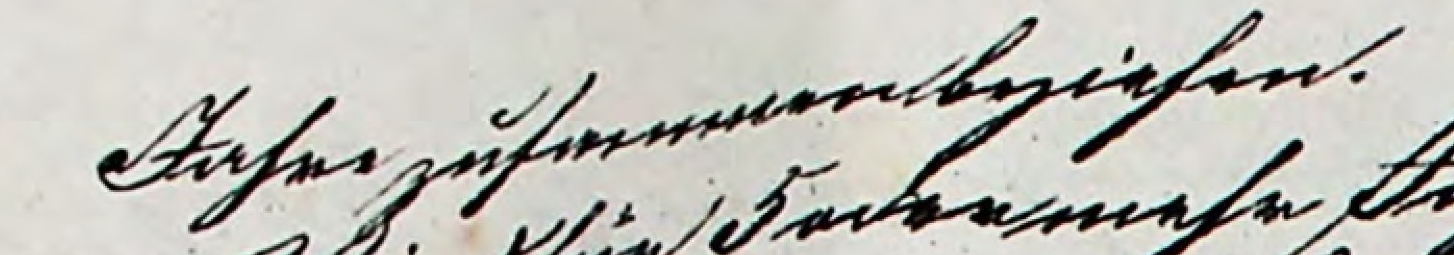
Jahre zusammen beziehen.
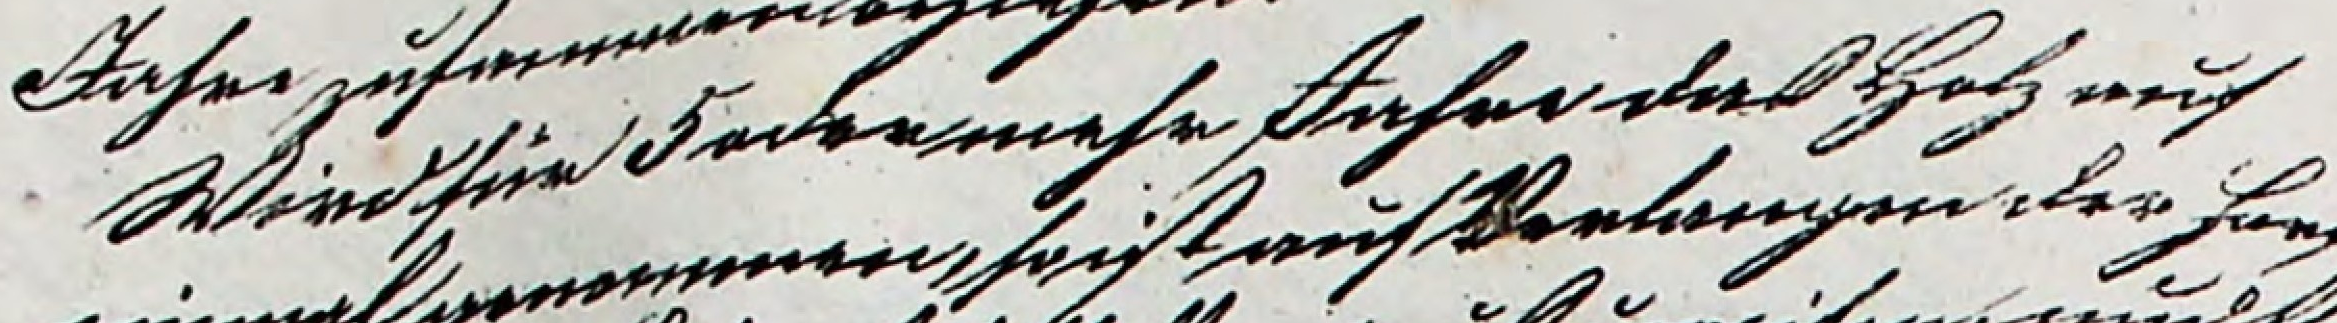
Wird für 5 oder mehr Jahre das Holz auf
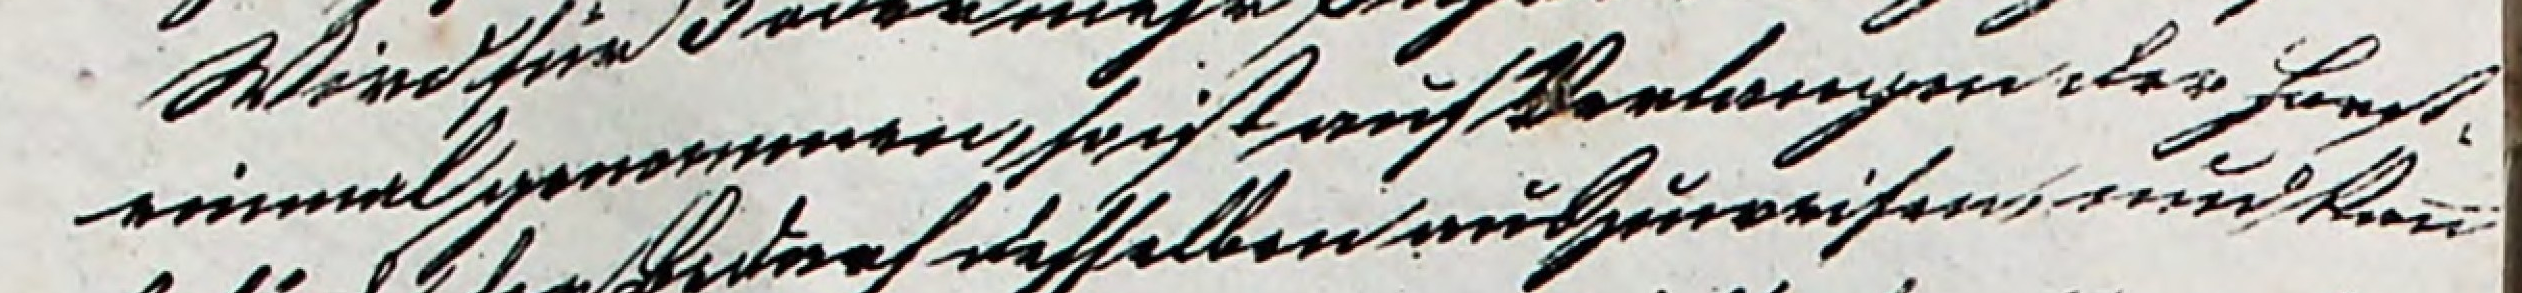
einmal genommen, so ist auf Verlangen der Forst„
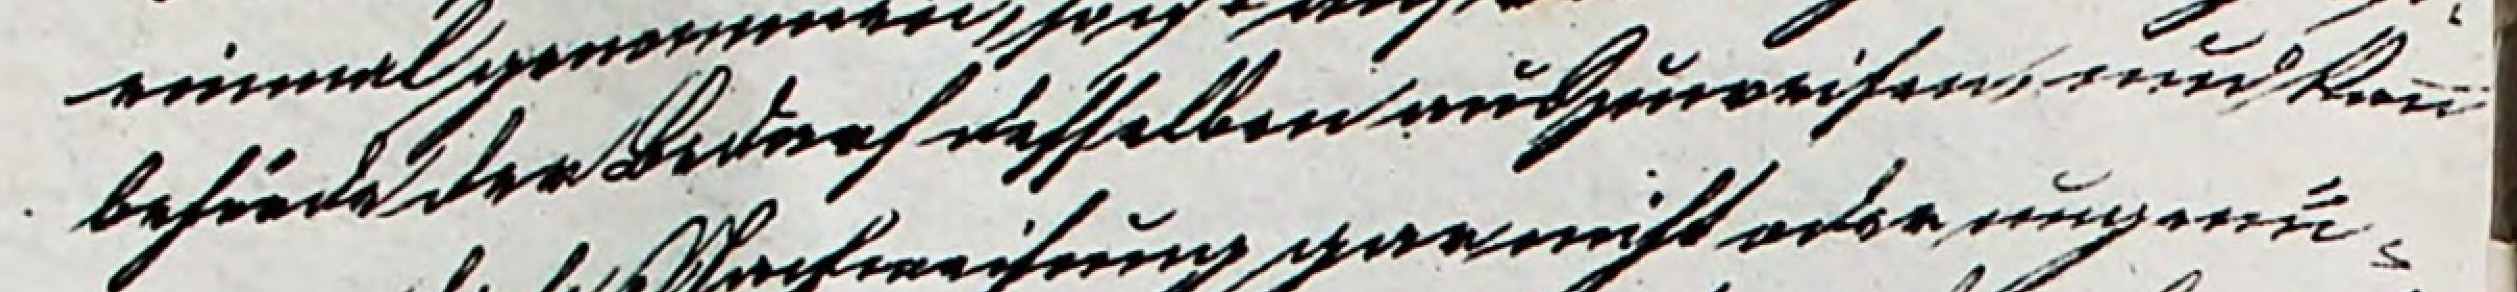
behörde der Bedarf desselben auszuweisen, und kann
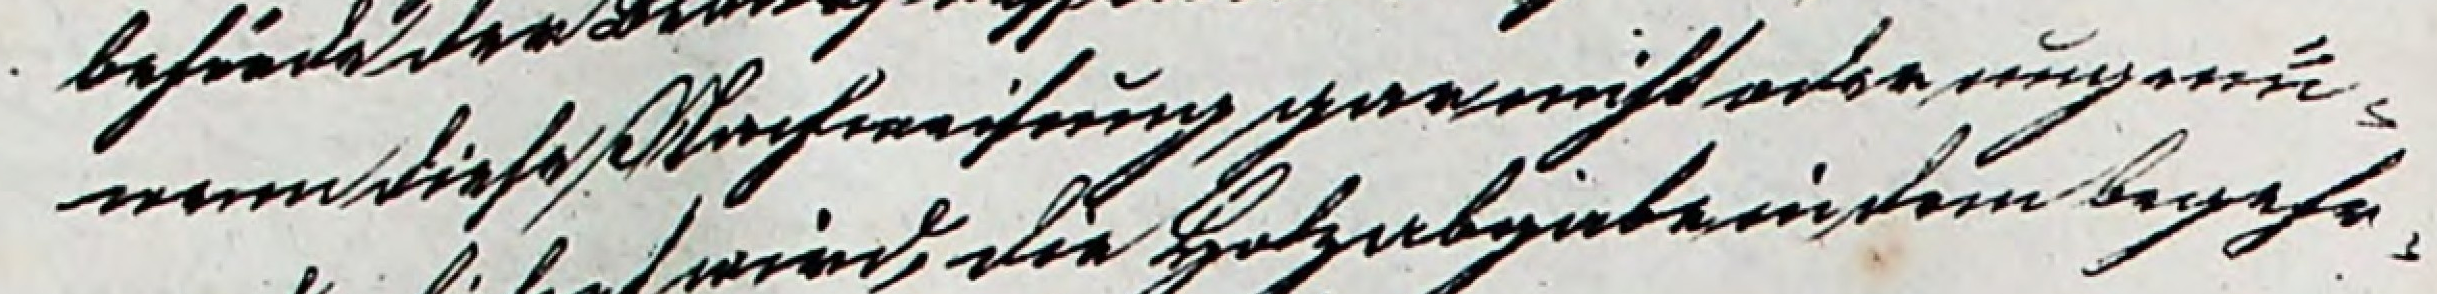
wenn diese Nachweihung gar nicht oder ungenü„
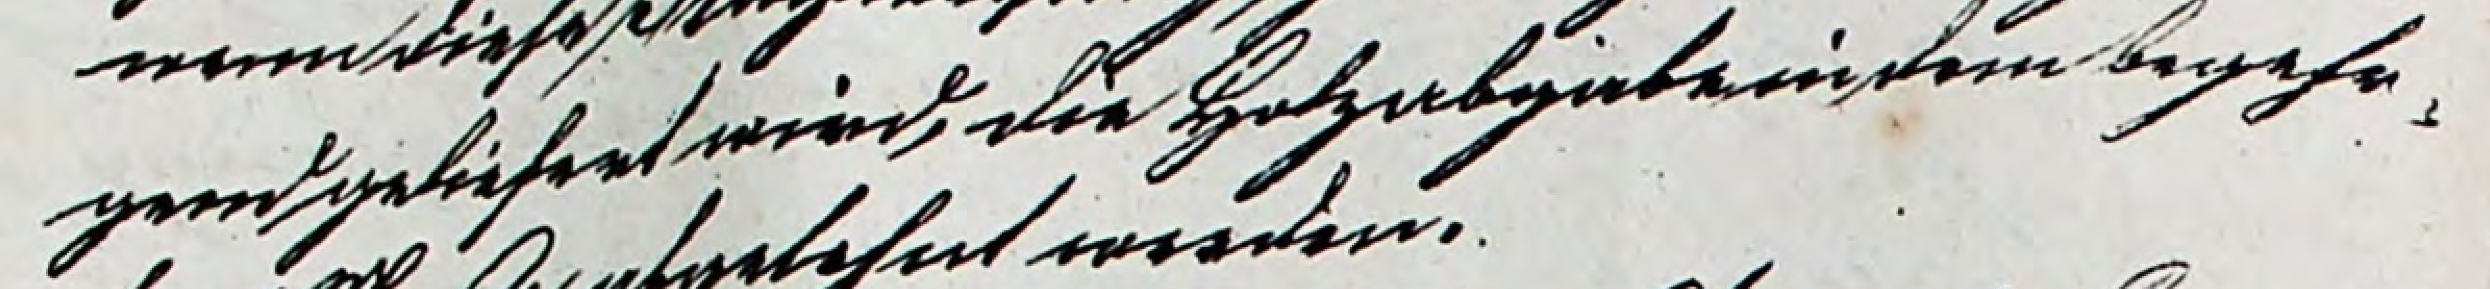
gend geliefert wird, die Holzabgabe in dem begehr„
